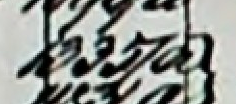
1335/a
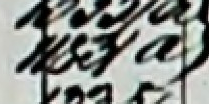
1183/a
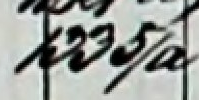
1335/a
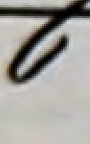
6
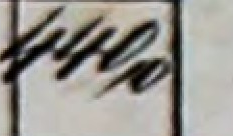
440,0
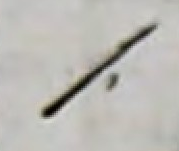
./.
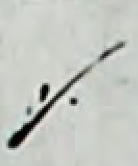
./.
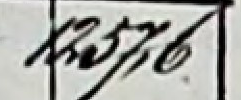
1257,6
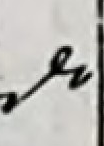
do
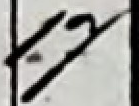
17
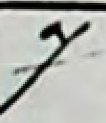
7
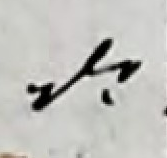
do
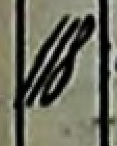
118
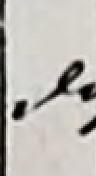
do
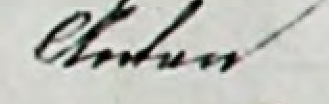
Anton
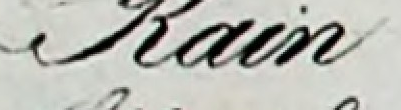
Kain
